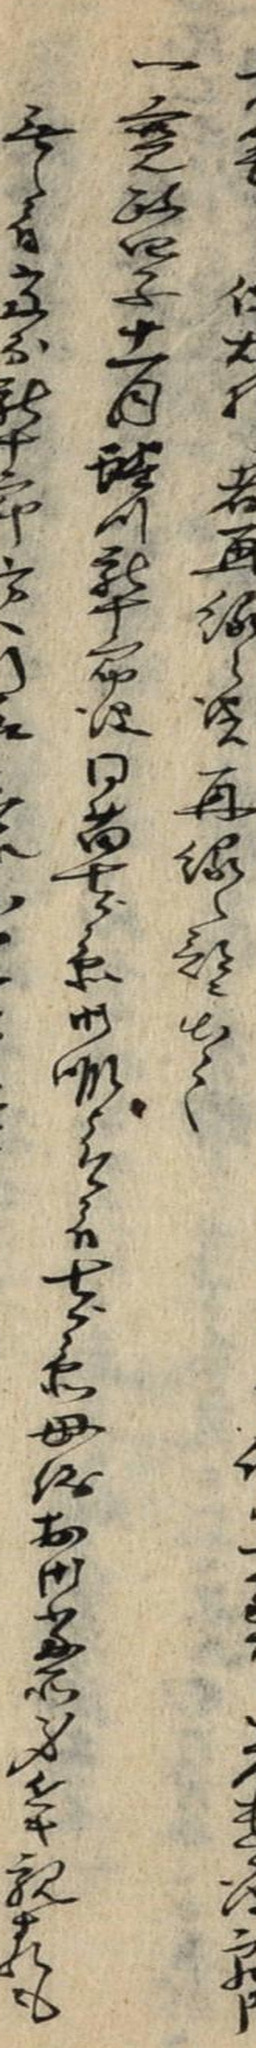一寛政四子十一月蜷川新十郎儀同苗七郎兵衛御暇被下候ニ付七郎兵衛母儀於御番所身近キ親類も
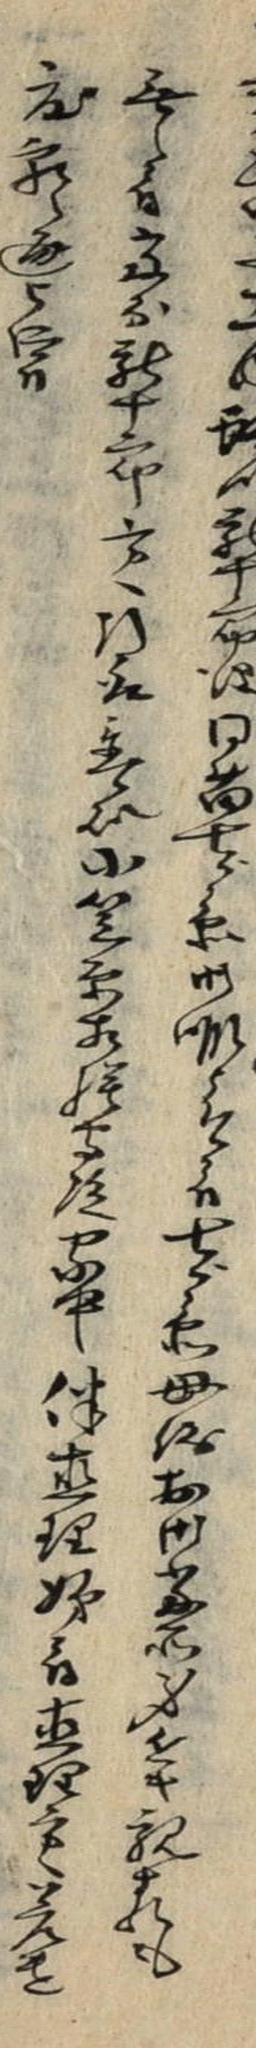無之ニ付当分新十郎方へ引取置候処小笠原相模守殿家中伴直理姉ニ付直理方へ差遣
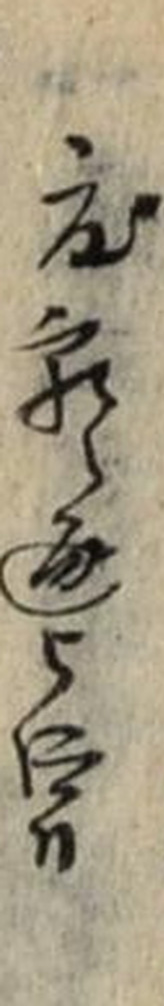度願之通被仰付
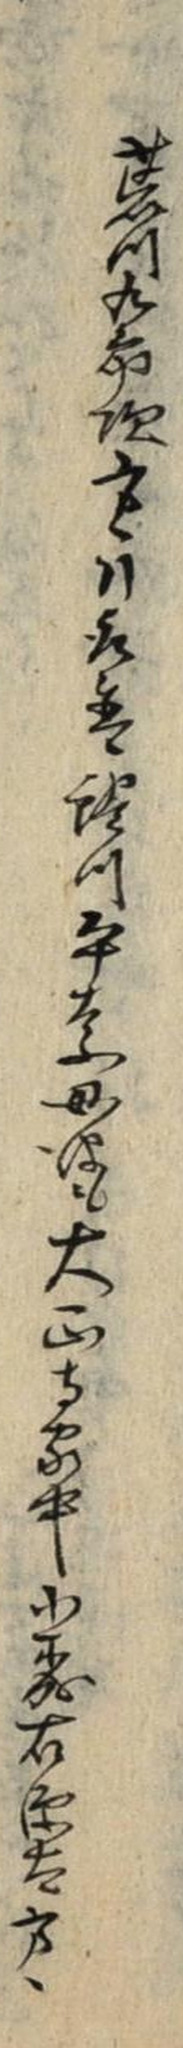一荒川九郎次方へ引取置候蜷川平太夫母儀も大正寺家中小森右源太方へ差遣申候
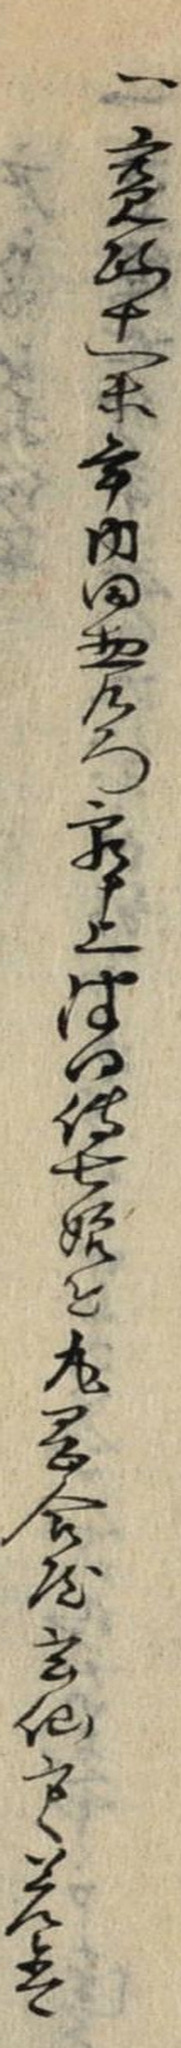一寛政十一未年内田惣九右衛門願申上津田伝七娘を丸岡合屋玄仙方へ差遣候
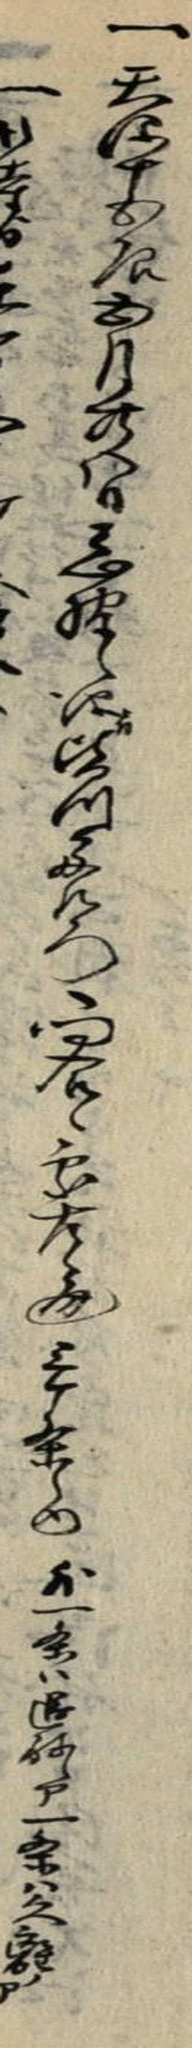一天保十五辰五月廿八日忌服之儀皆川多左衛門へ問合候処左之通三ヶ条之内外一条ハ追放之部一条ハ久離之部
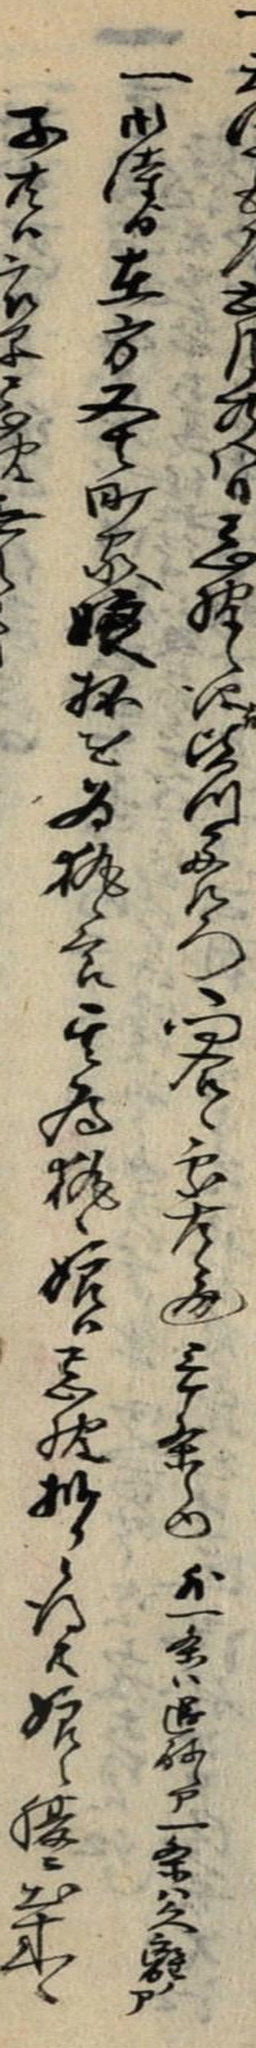一御侍ゟ在方又者町屋娘等を為執候節其為執候娘ハ忌服掛り候得共娘之腹ニ出来候
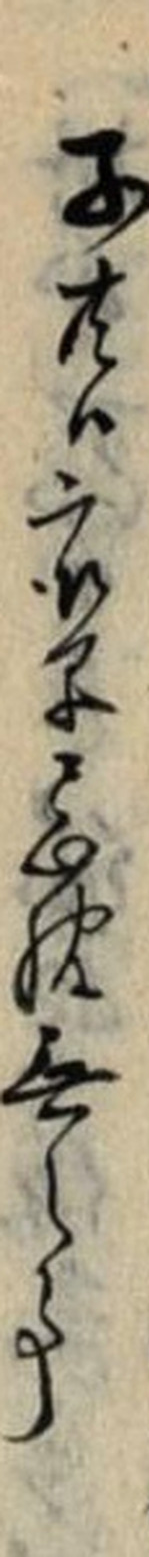子共ハ最早忌服無之事
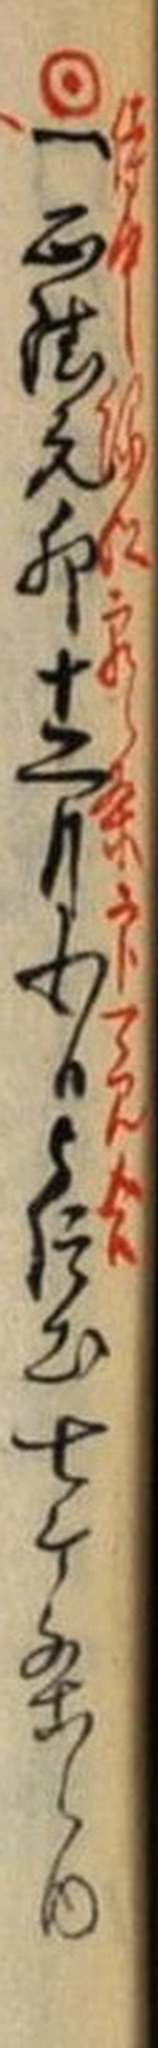一正徳元卯十二月五日被仰出七ヶ条之内
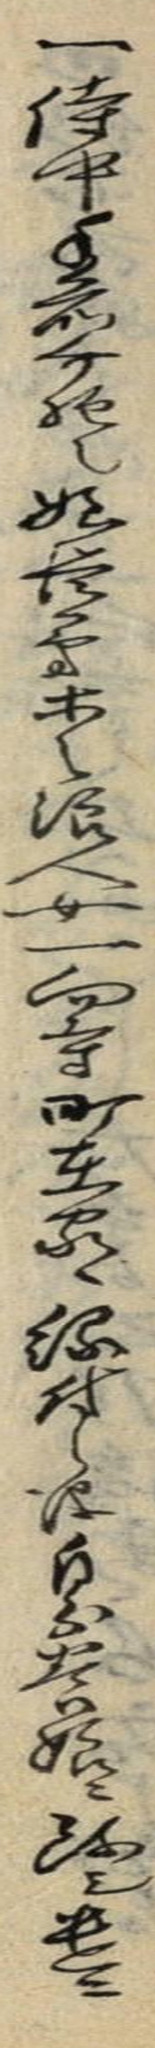一侍中手前介抱候姪従弟等之浪人女一向寺町在家へ縁付候儀自分養娘に致し遣ニ
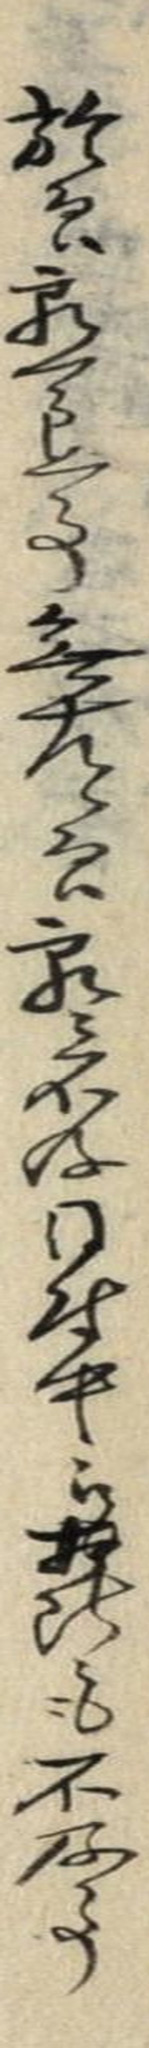於而ハ願可申上事無左候而ハ願ニ不及目付中江相断ニも不及事
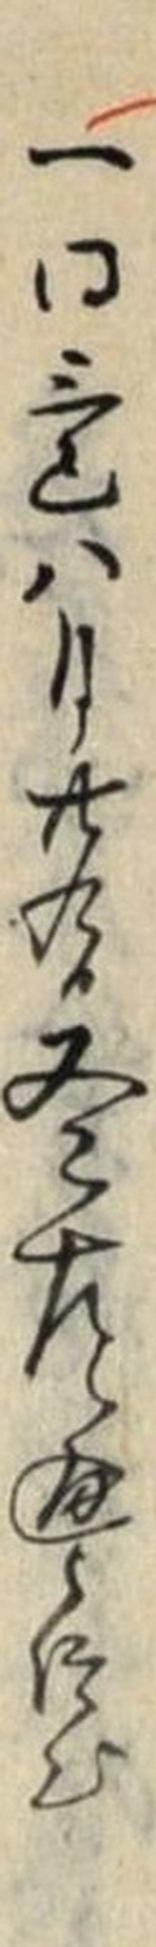一同三巳八月廿九日又々左之通被仰出
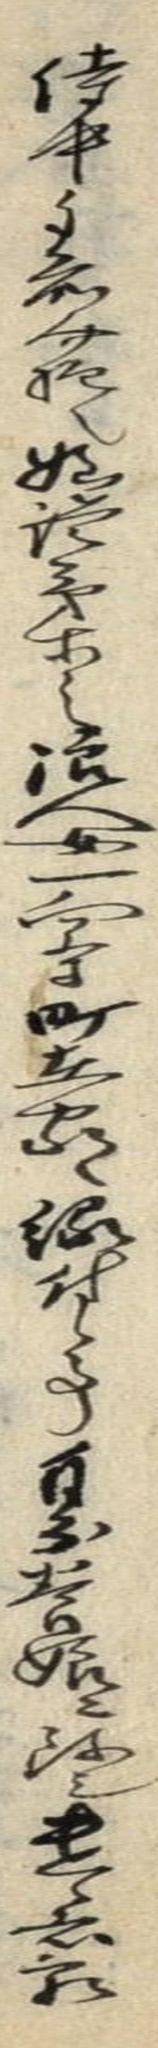侍中手前介抱候姪従弟之浪人女一向寺町在家へ縁付候事自分養娘ニ致シ遣候者願
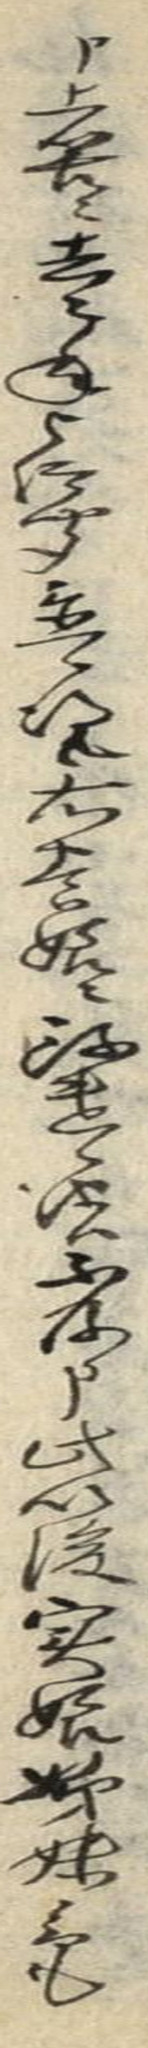申上筈ニ去々年被仰聞置候得共右養娘ニ致遣候儀ハ不及申此以後実娘姉妹ニ而も
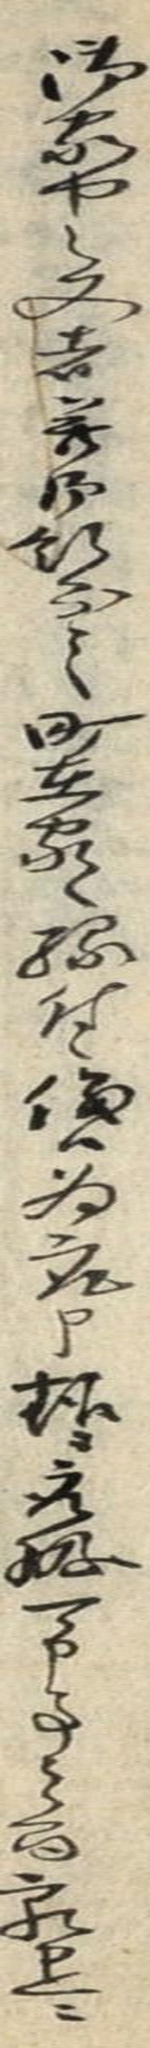御家中之又者并御領分之町在家へ縁付候儀ハ為取申様ニ取扱可申事ニ候間願申上ニ
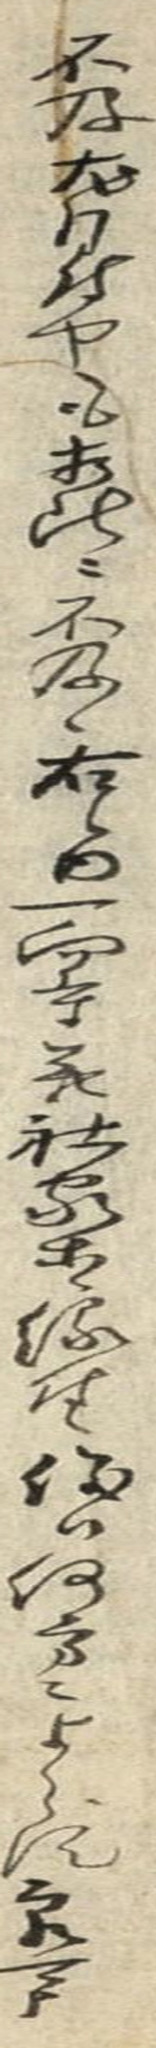不及尤目付中へも相断ニ不及候右之内一向寺并社家等へ縁付候儀ハ何方ニよらす願可申
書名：養子縁組之部
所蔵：福井県文書館 Fukui Prefectural Archives
